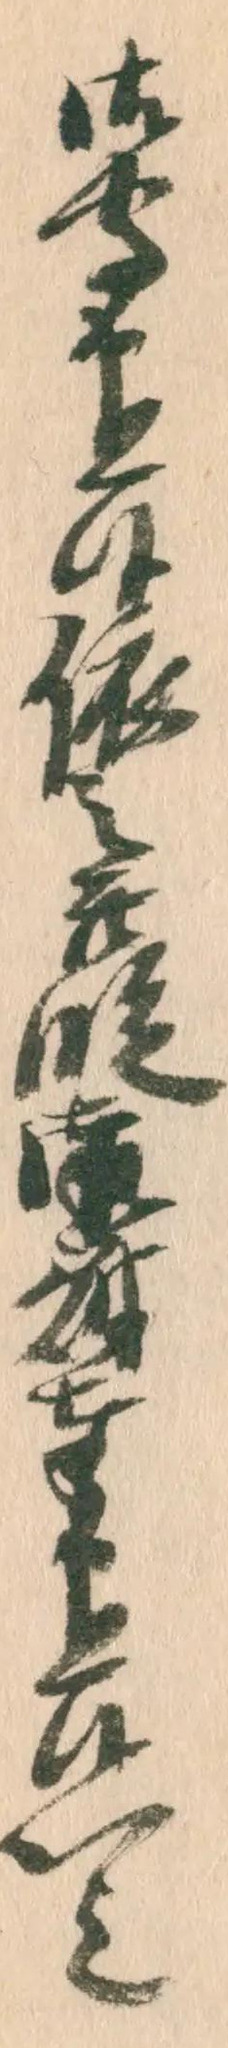御守申上候依之此段御訴奉申上候以上
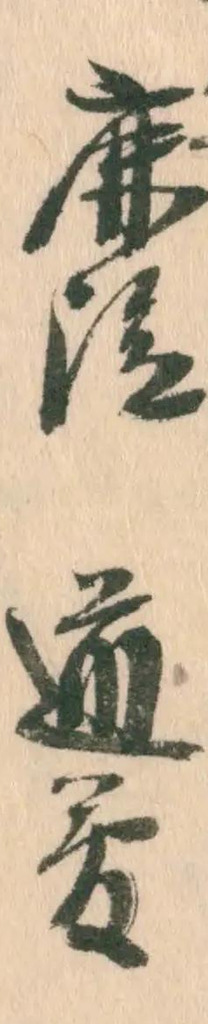鹿塩道菅
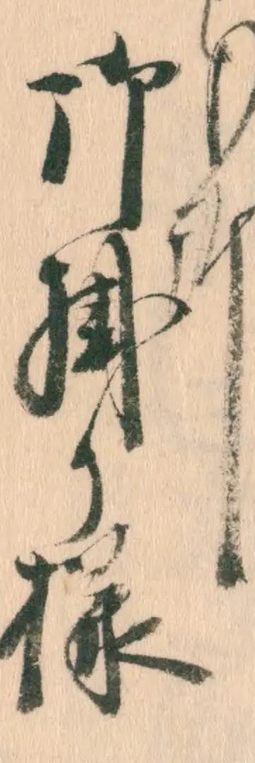御掛り様
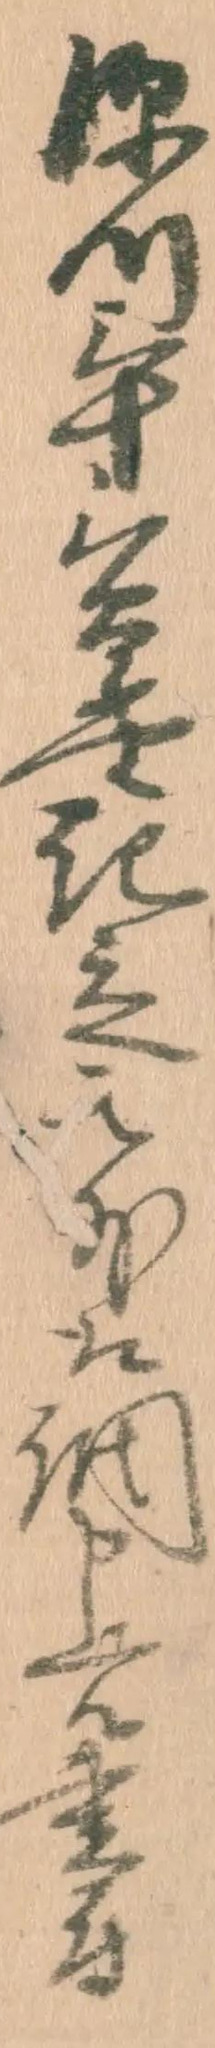│深川三十三間堂起立之外取調申上候書付
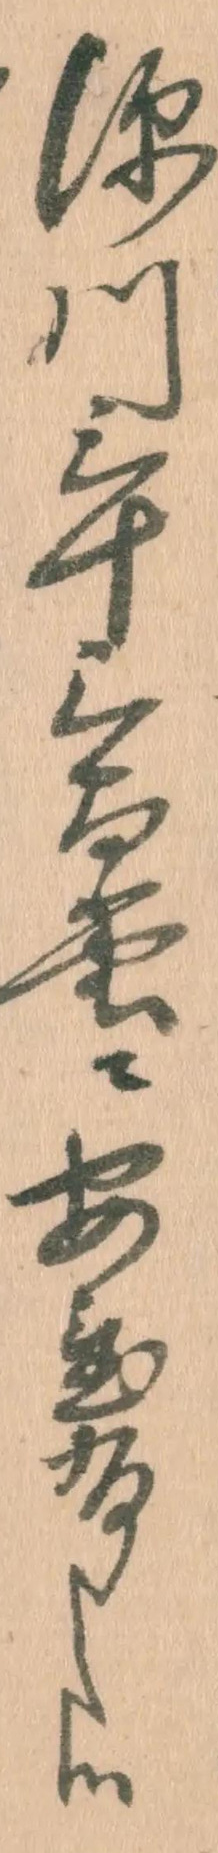深川三十三間堂ニ安置有之候
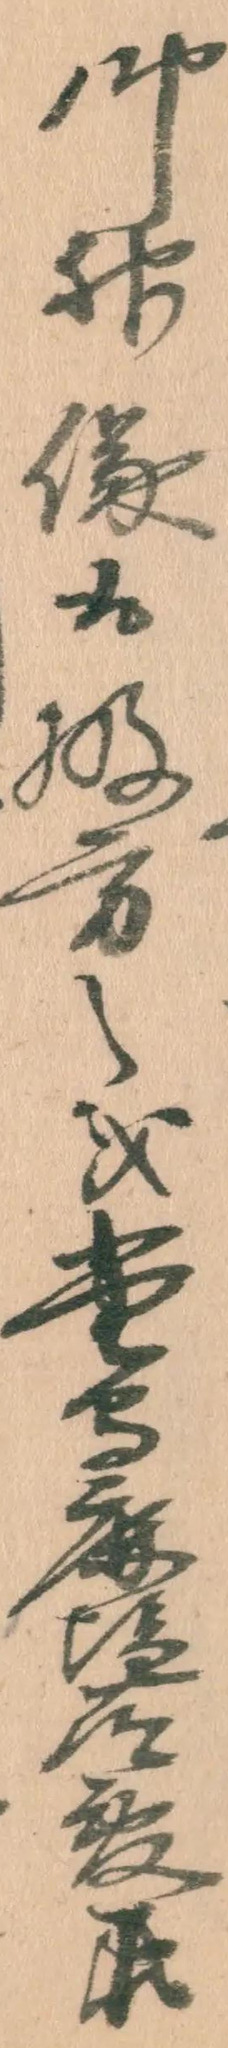御神像取扱方之義堂守鹿塩道菅え
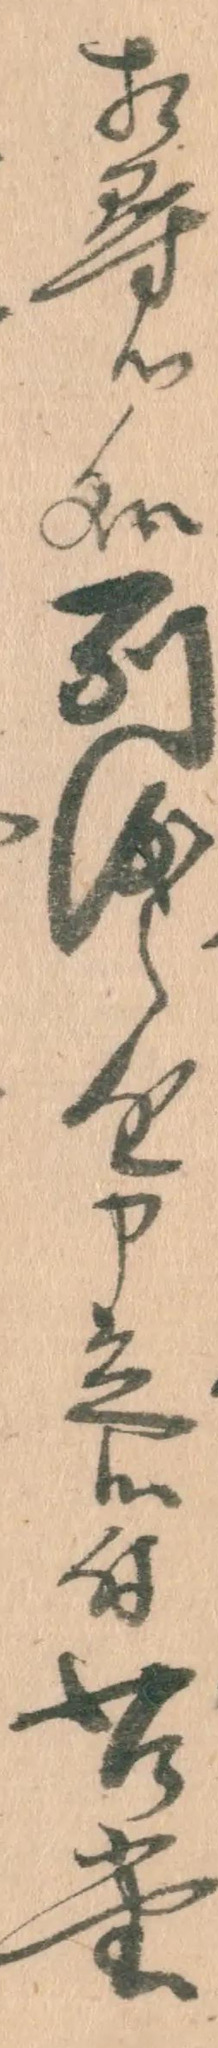相尋候処別紙之通申立候付右堂
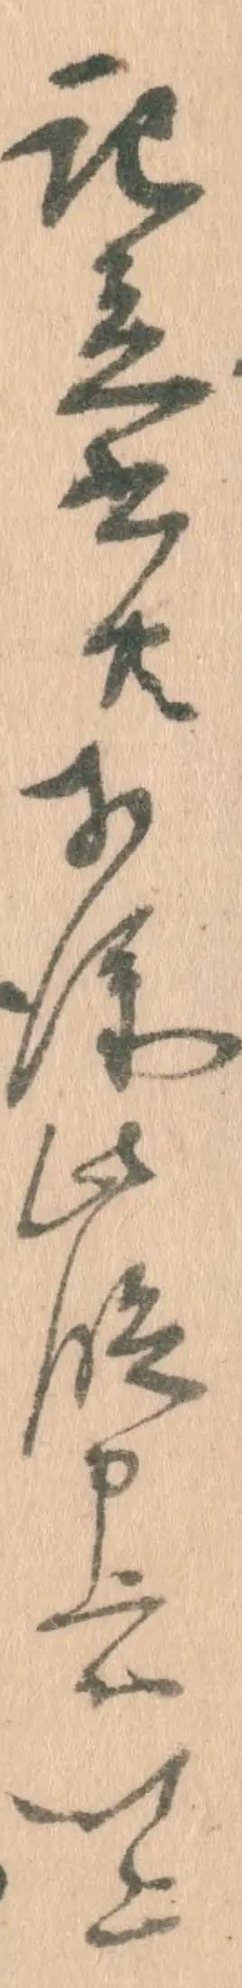起立書共相添此段申上候以上
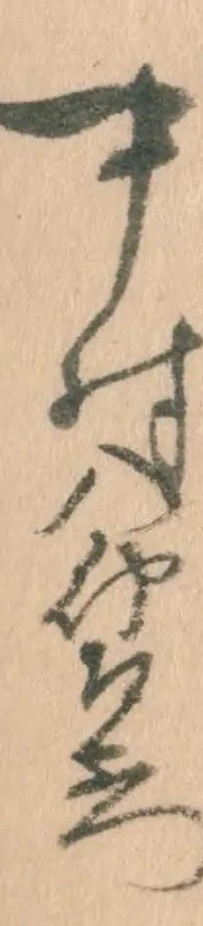中村八郎左衛門

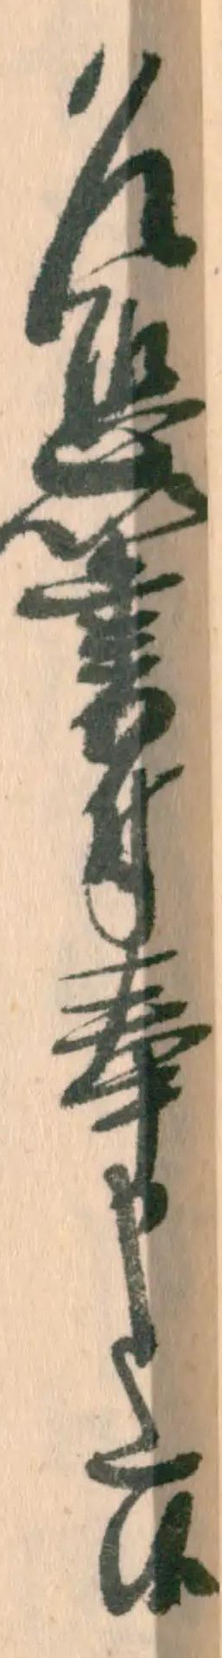乍恐以書付奉申上候
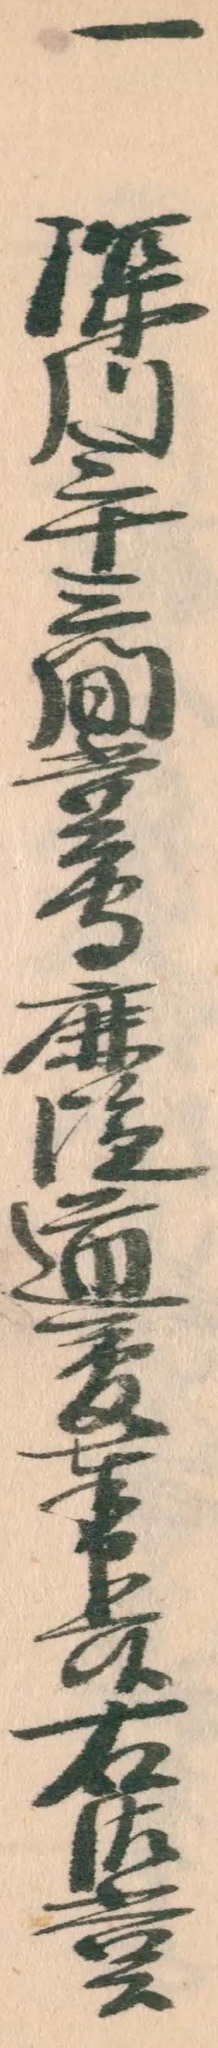一深川三十三間堂守鹿塩道菅奉申上候右御堂
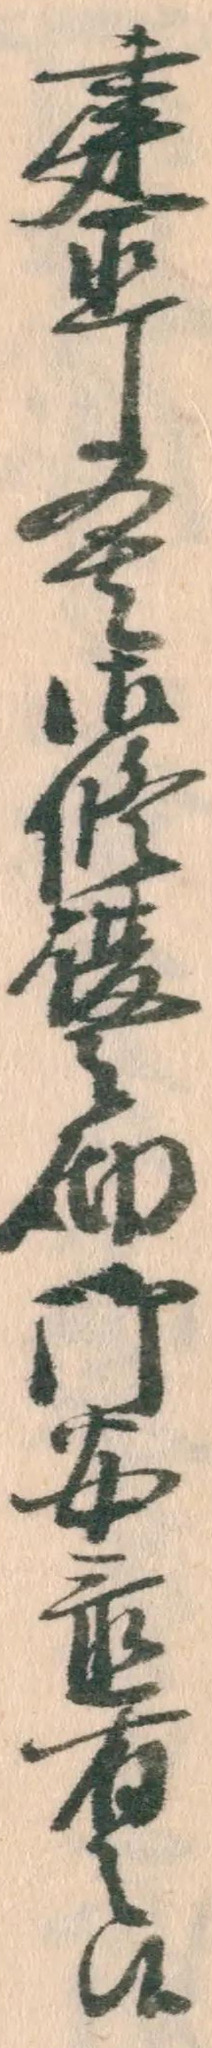建直し又者御修復之砌御安置有之候
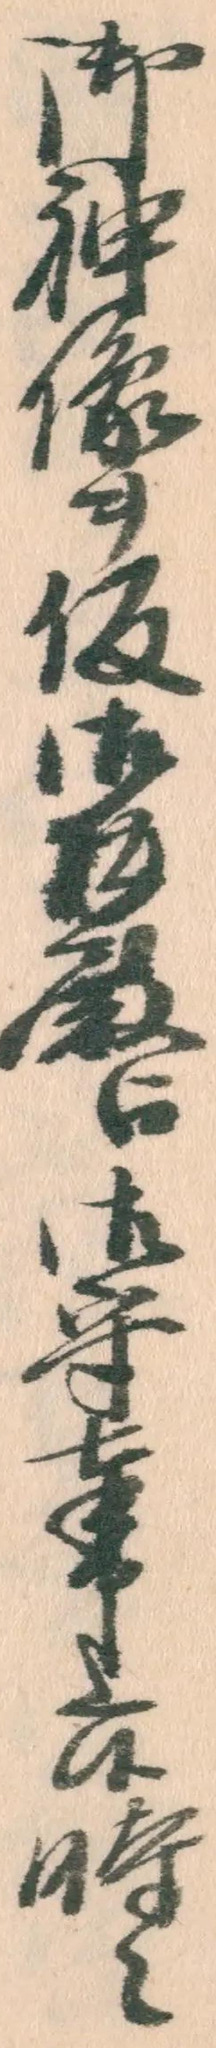御神像ヲ仮御拝殿江御守奉申上候時ニ
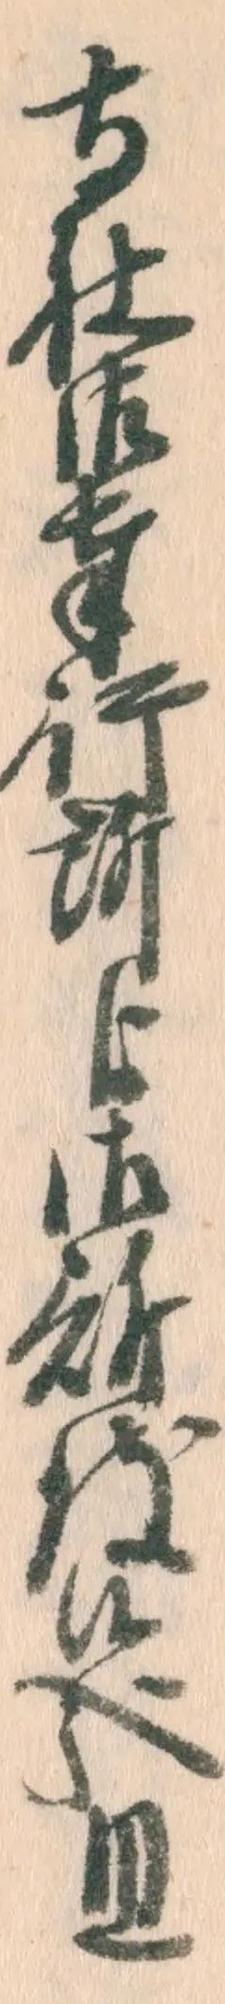寺社奉行所江御訴致候哉且
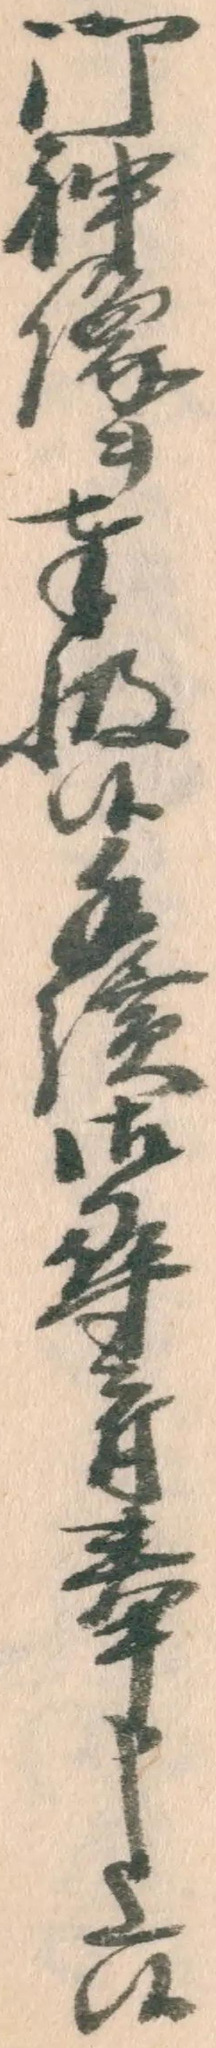御神像ヲ奉扱候手続御尋ニ付奉申上候

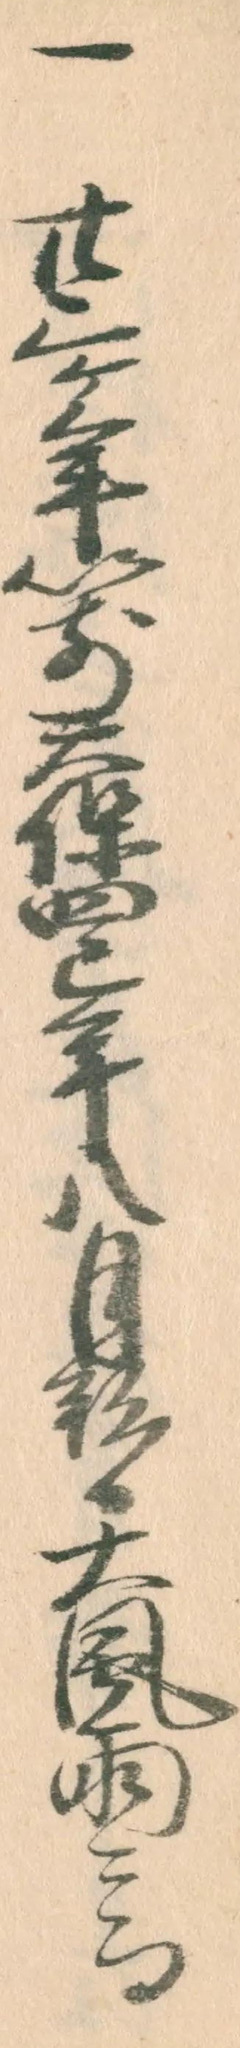廿三ヶ年以前天保四巳年八月朔日大風雨ニ而
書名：三十三間堂. [1]
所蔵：国立国会図書館 National Diet Library, JAPAN
